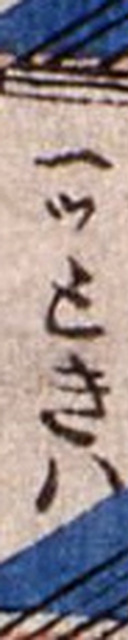一つときは
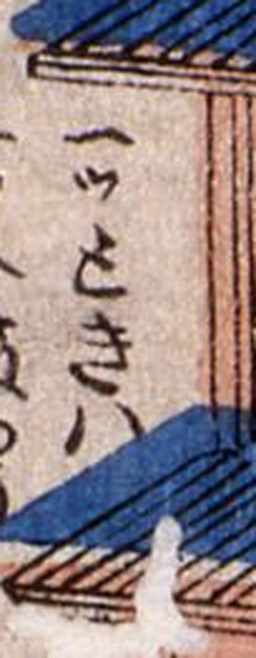一つときは
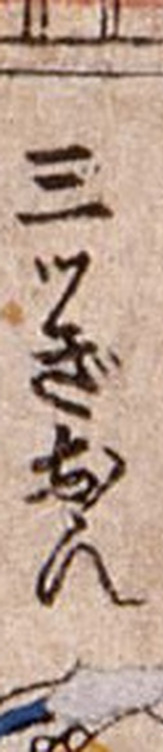三つぎおん
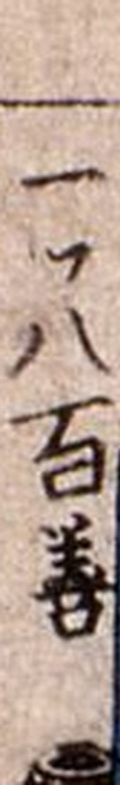一つ八百善
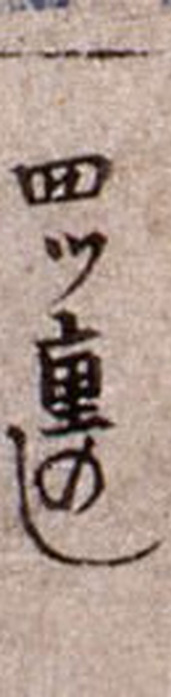四つ重のし
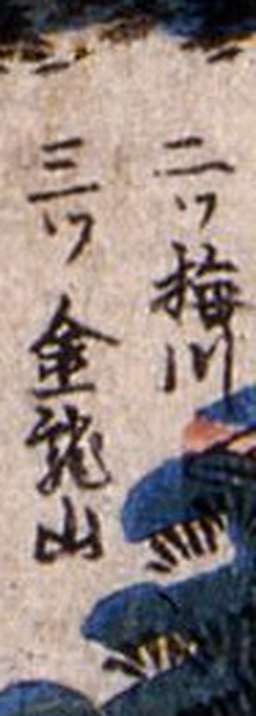三つ金龍山
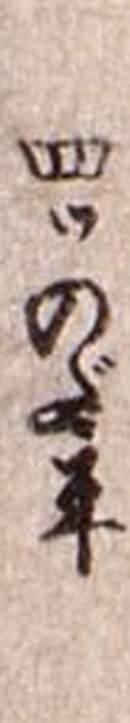四つのだ平
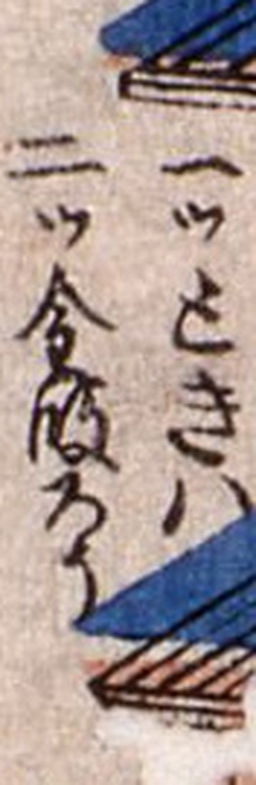二つ金波ろう
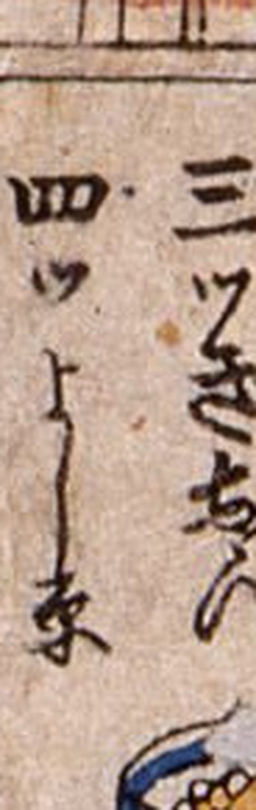四つよし原
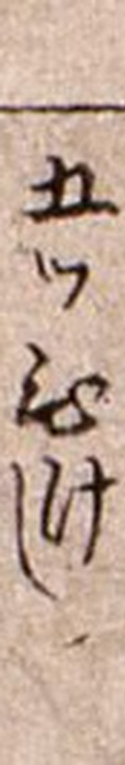五つひけし
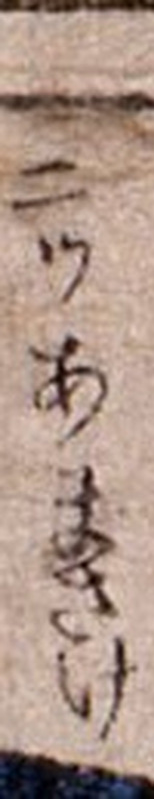二つあまさけ
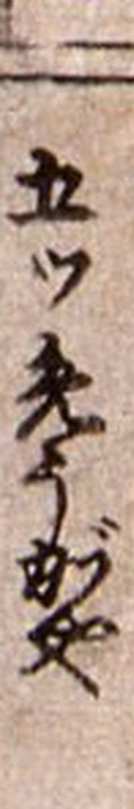五つめうがや
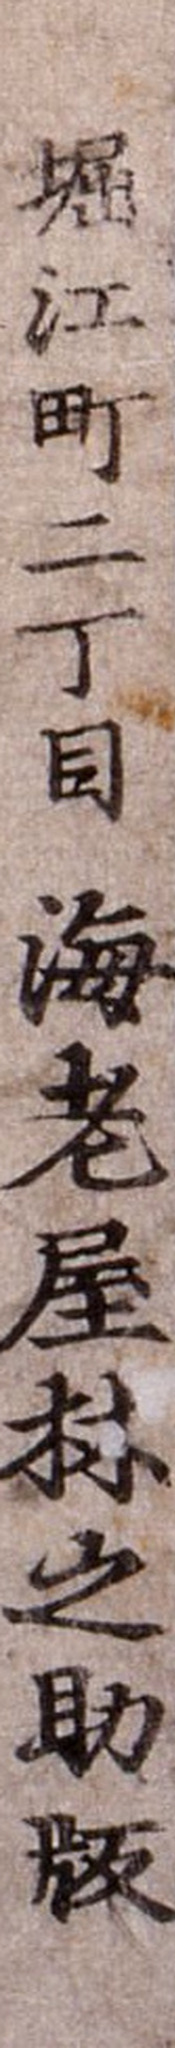堀江町二丁目海老屋林之助版

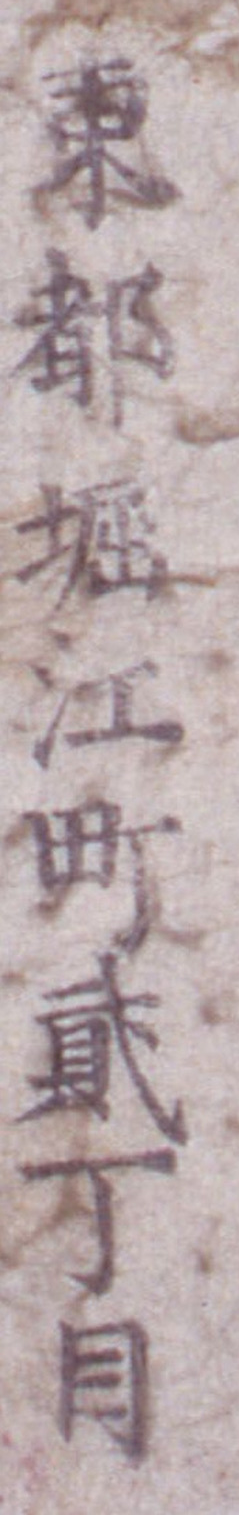東都堀江町貮丁目
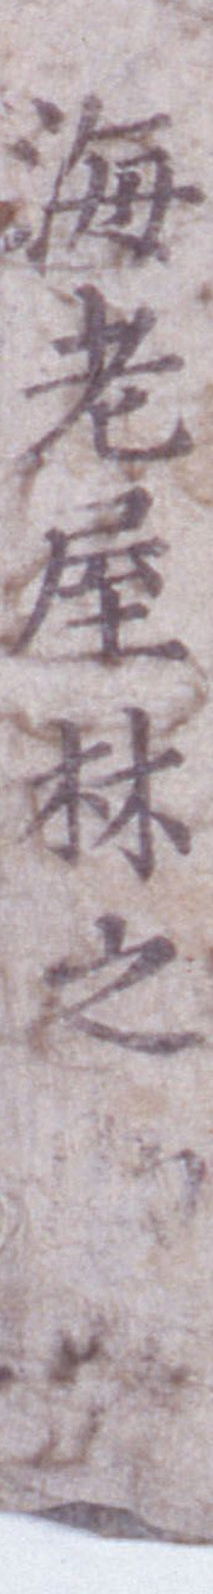海老屋林之
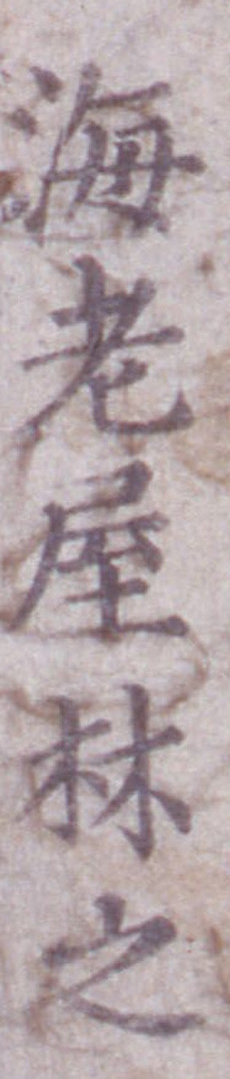海老屋林之
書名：新版御府内流行名物案内雙六
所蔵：東京学芸大学附属図書館
